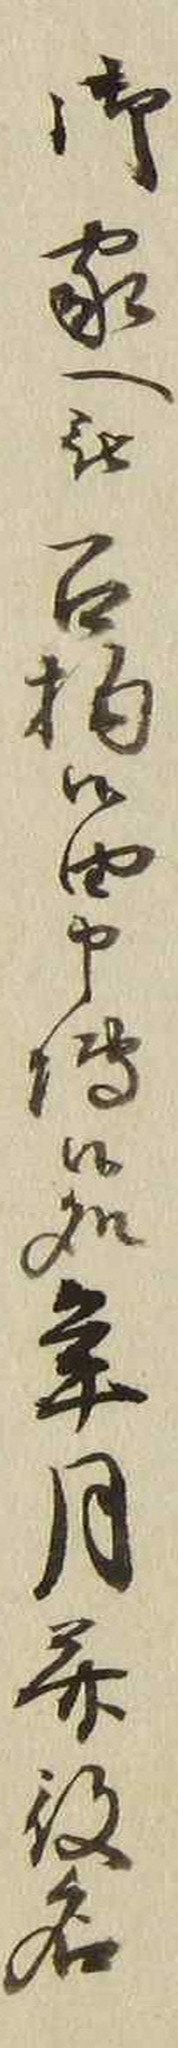御家ヘ被召抱候由申伝候處年月幷役名
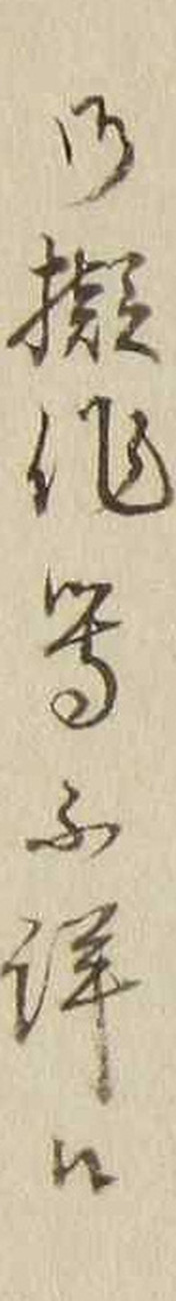御擬作等ふ詳候

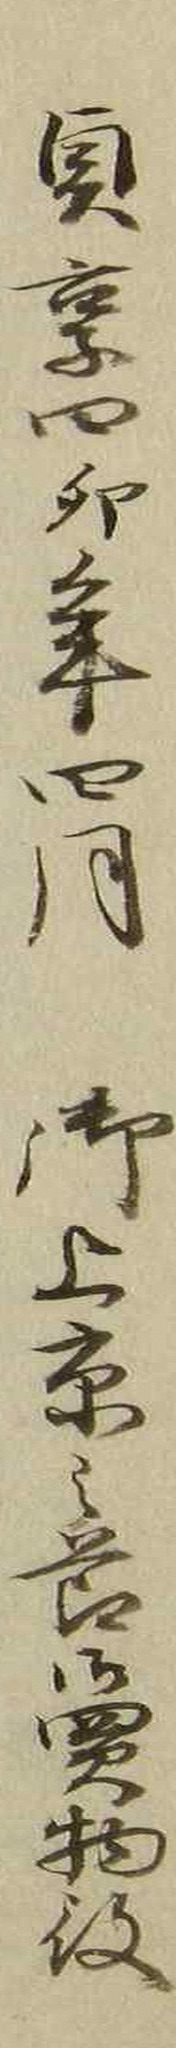一貞享四夘年四月御上京之節御買物役
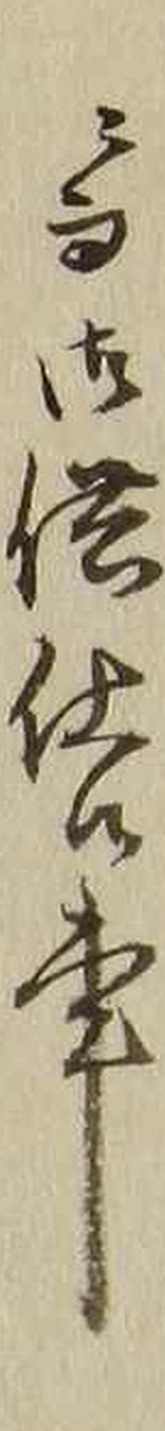二而御供仕候事
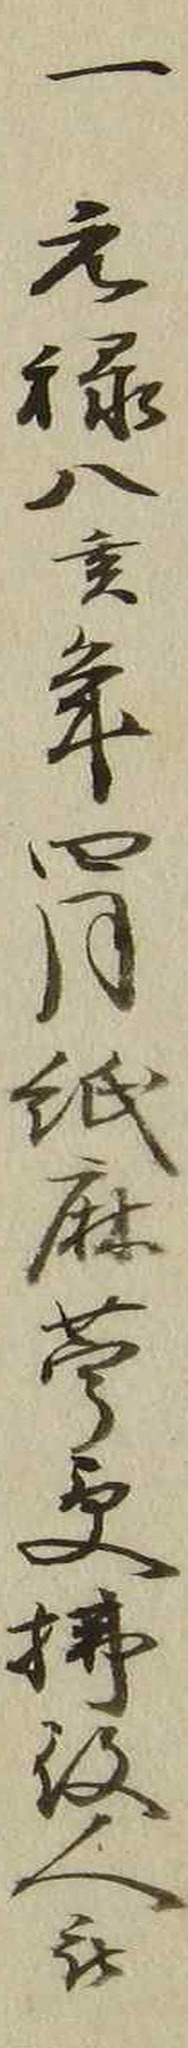一元禄八亥年四月紙麻苧受払役人被
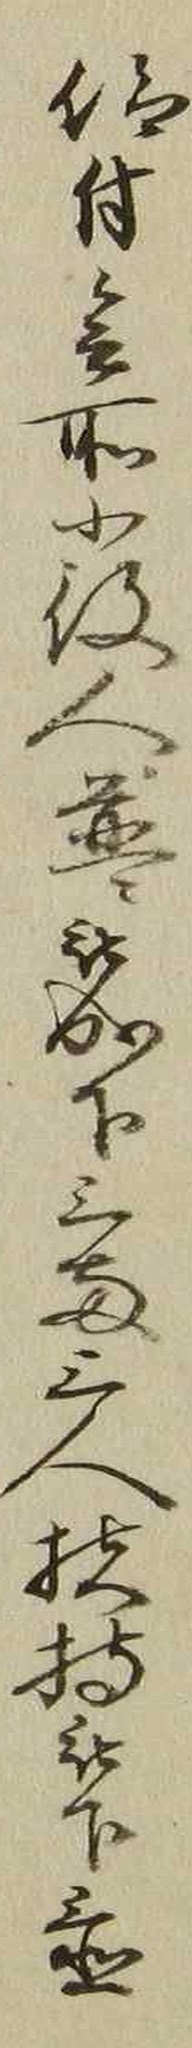仰付会所小役人並ニ被成下三両三人扶持被下置
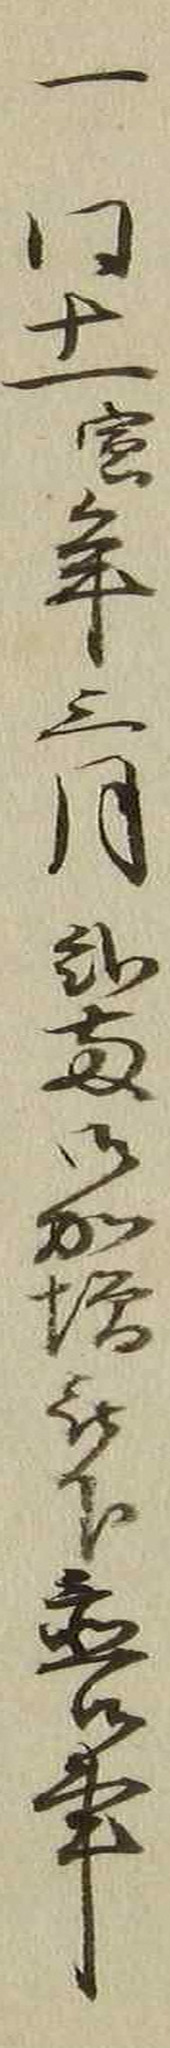一同十一寅年三月弐両御加増被置候事
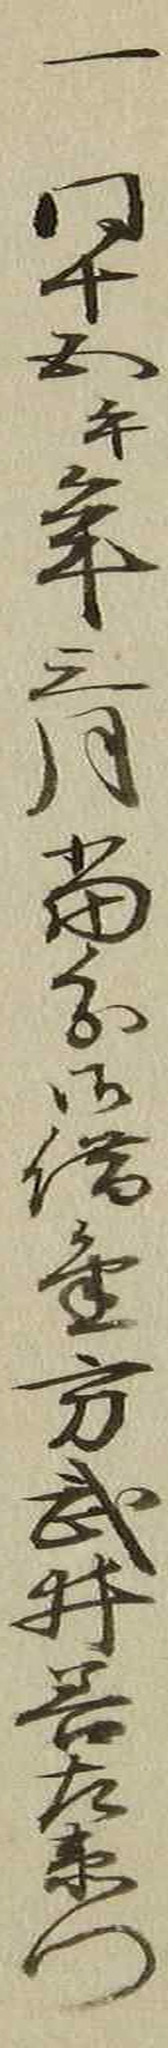一同十五午年三月当分御借金方武井善左衛門
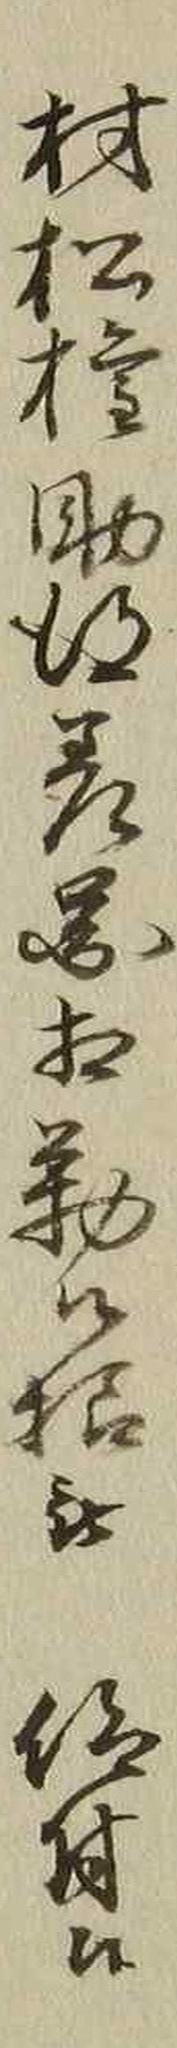村松権助得差図相勤候様被仰付候
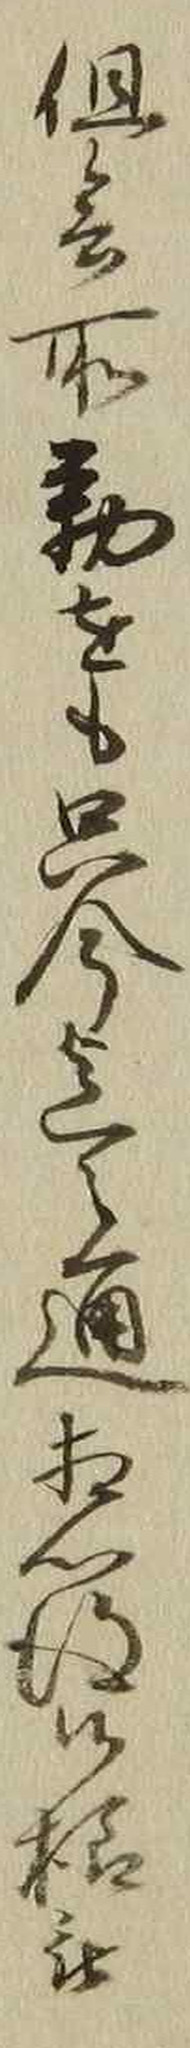但会所勤をも只今迄之通相心得候様被
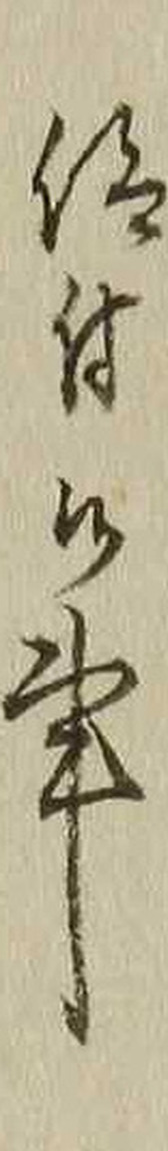仰付候事
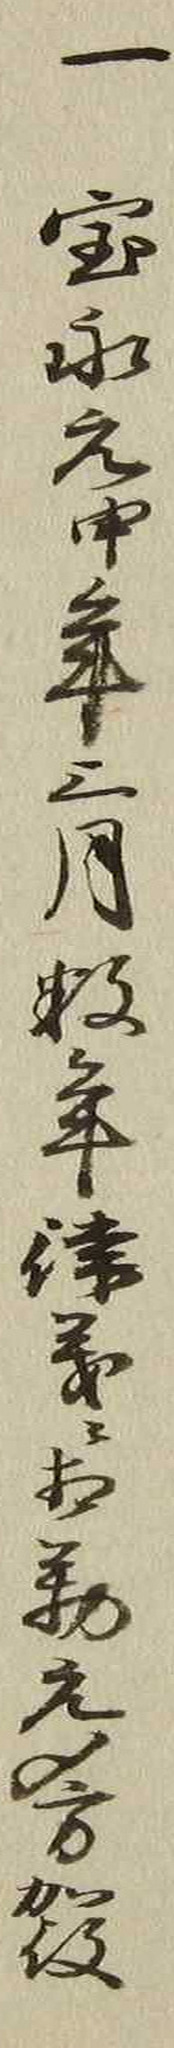一宝永元申年三月数年律義二相勤元〆方加役
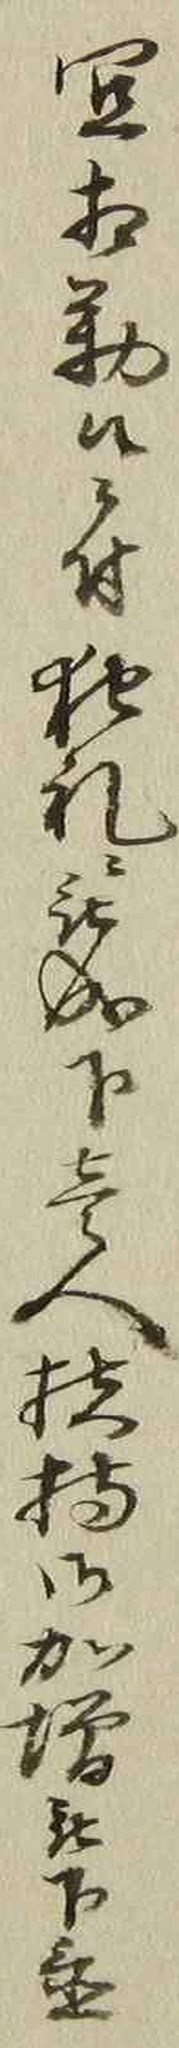宣相勤候ニ付独礼二被成下壱人扶持御加増被下置
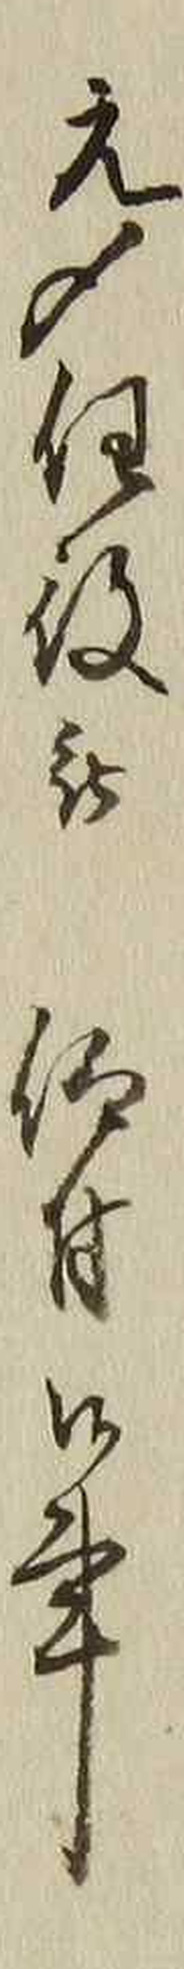元〆伺役被仰付候事
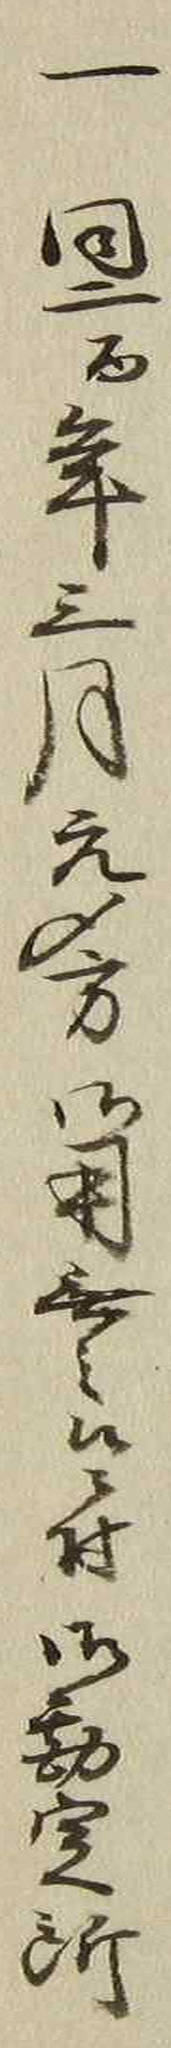一同ニ酉年三月元〆方御用無之候二月御勘定所
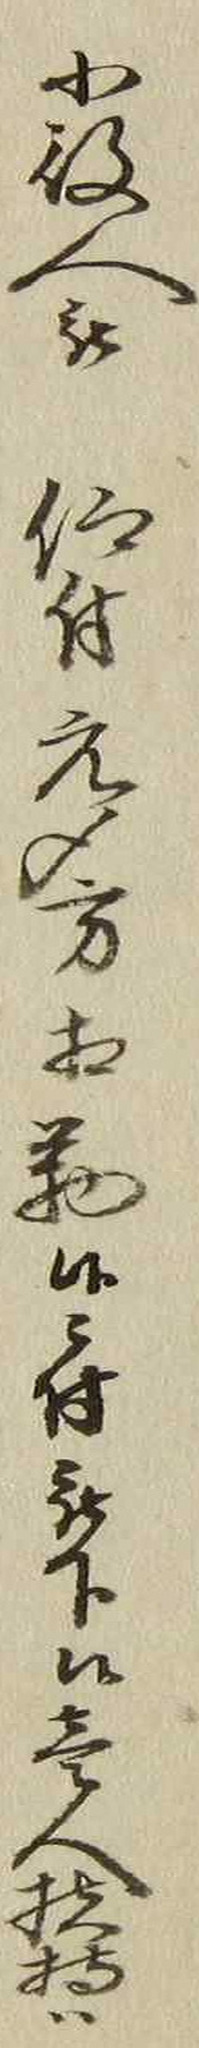小役人被仰付元〆方相勤候ニ付被下候壱人扶持ハ
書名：諸士系譜　巻之114　か之部22
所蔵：会津若松市立会津図書館
